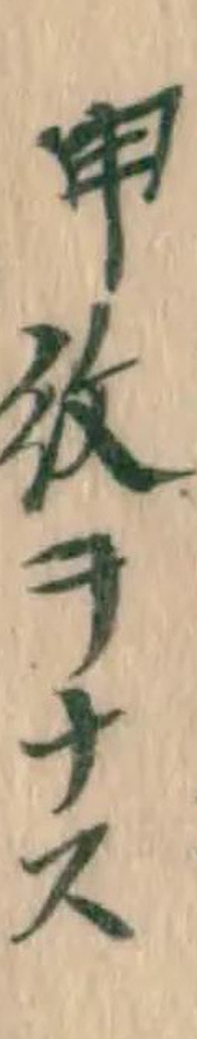甲紋ヲナス
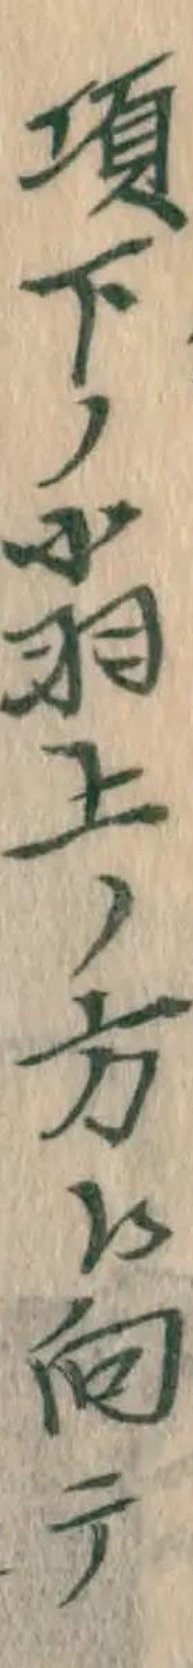頂下ノ小羽上ノ方ト向テ
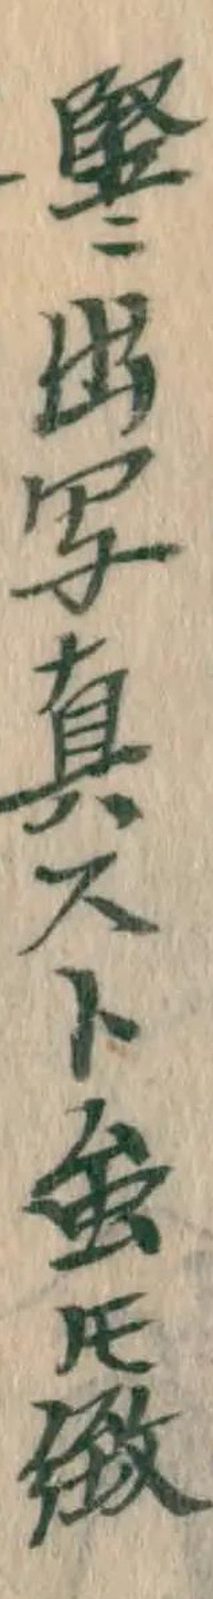竪ニ出写真スト虽トモ緻
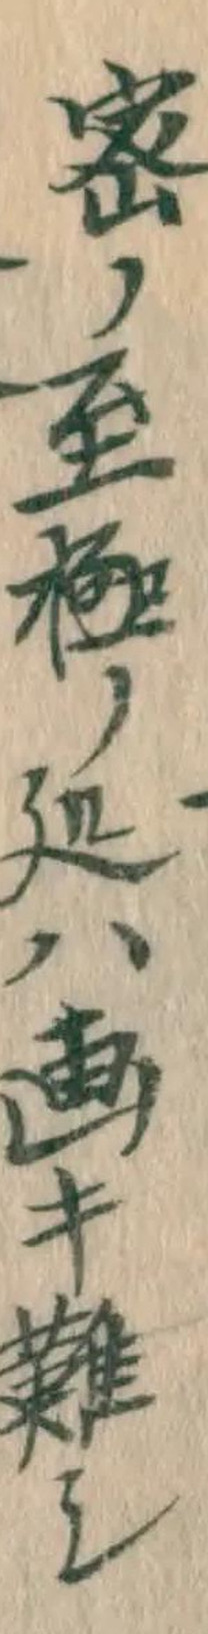密ノ至極ノ処ハ画キ難シ
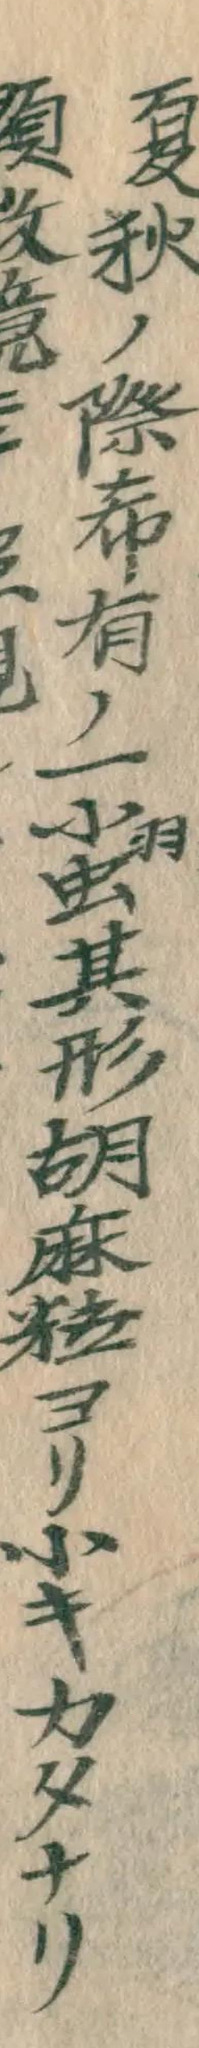夏秋ノ際希有ノ一小羽虫其形胡麻粒ヨリ小キカタナリ
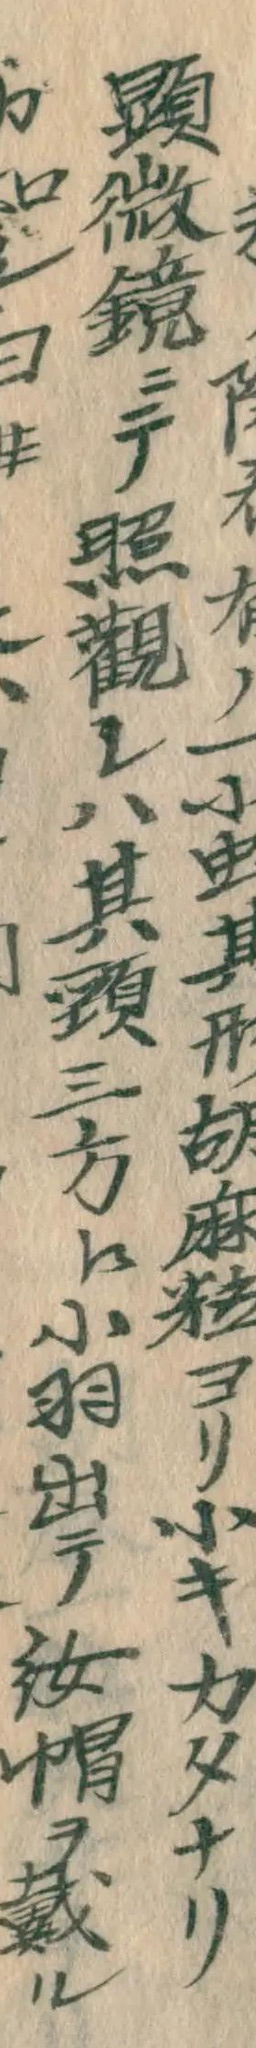顕微鏡ニテ照觀レハ其頸三方ニ小羽出テ帽ヲ戴ル
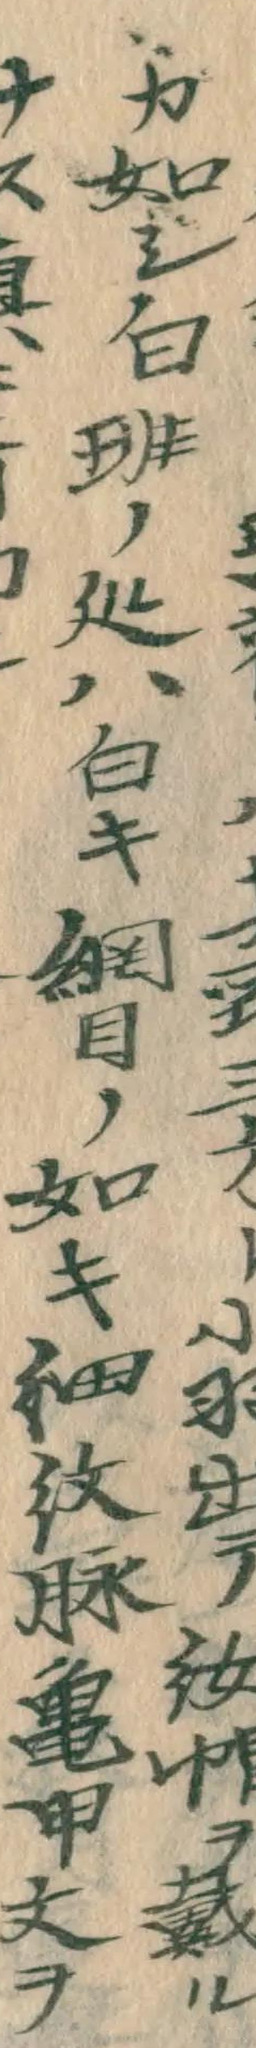カ如シ白班ノ処ハ白キ網目ノ如キ細紋脉亀甲門文ヲ
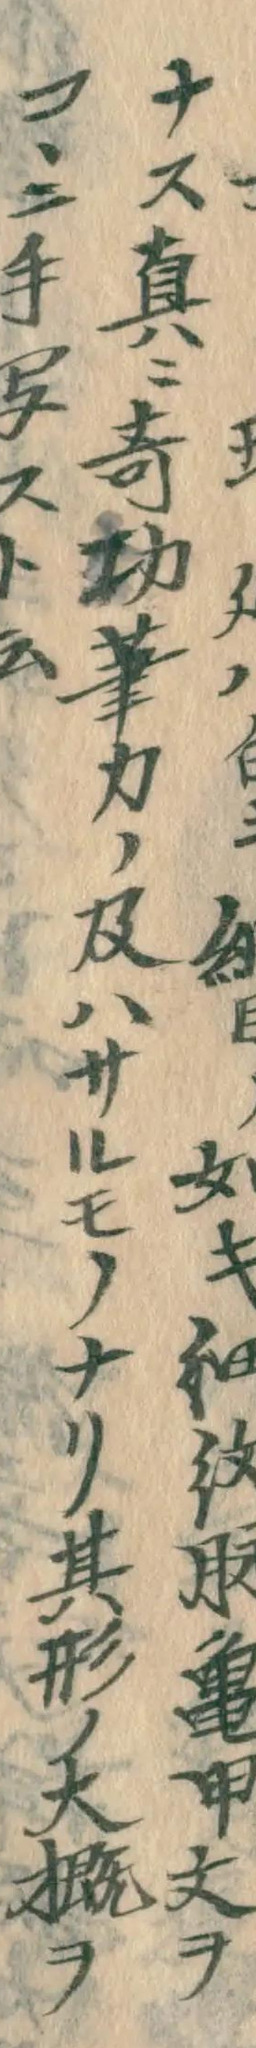ナス真ニ奇功筆力ノ及ハサルモノナリ其形ノ大概ヲ
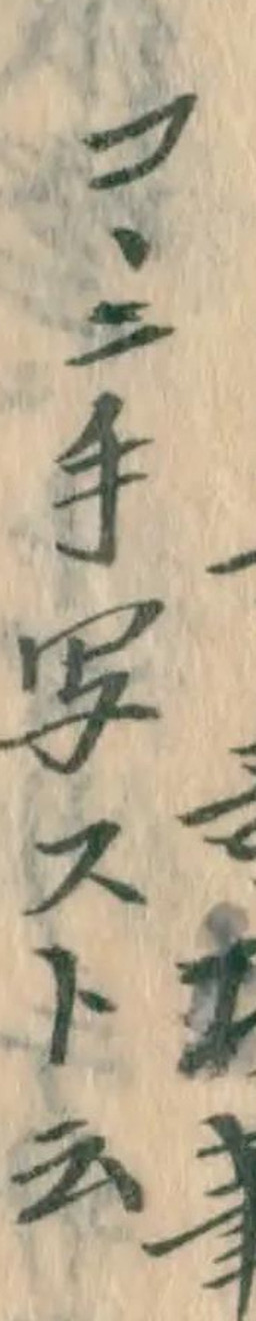コヽニ手写スト云

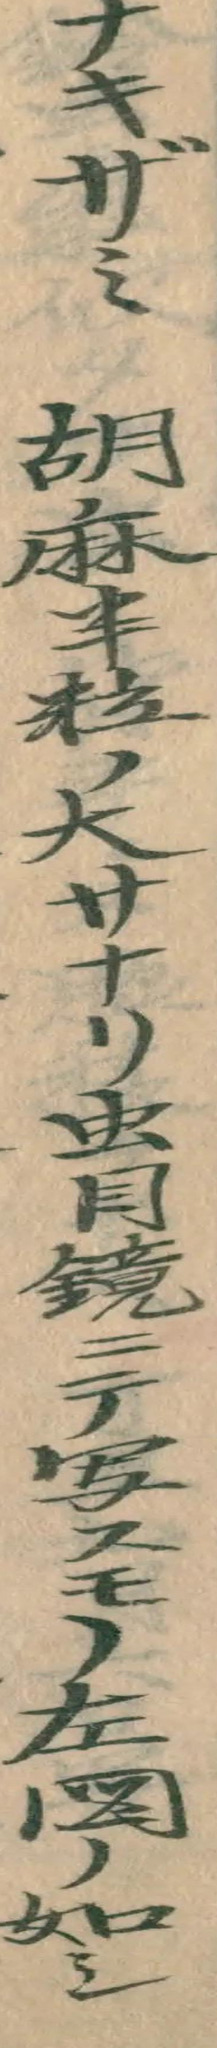ナキザミ胡麻半粒ノ大サナリ虫目鏡ニテ写スモノ左図ノ如シ
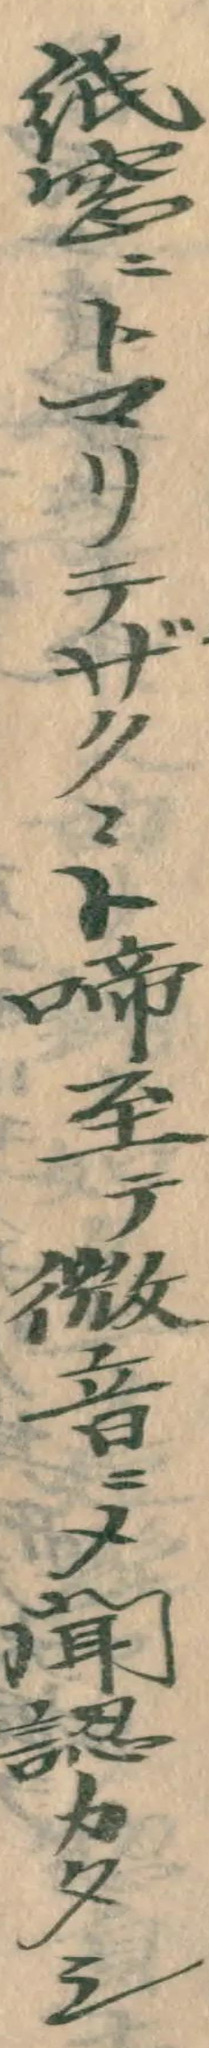紙窓ニトマリザクヽト啼至テ微音ニシテ聞認カタシ
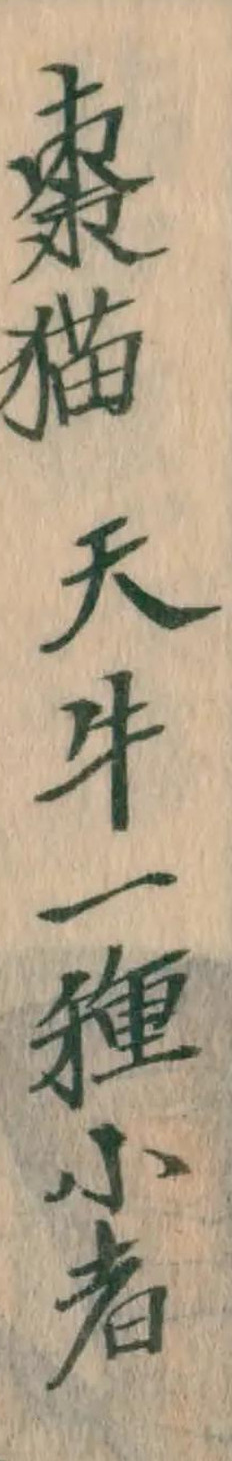棗猫天牛一種小者
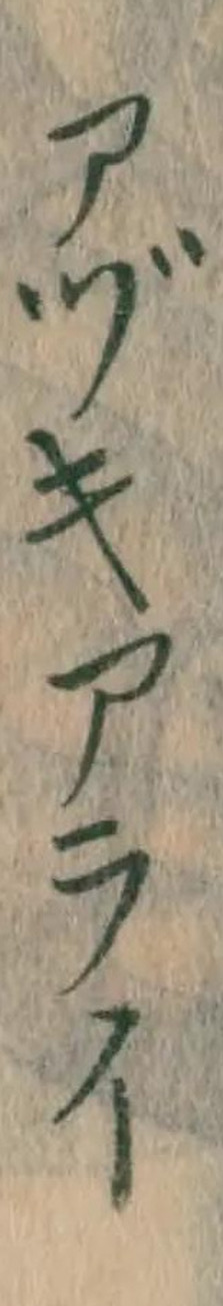アヅキアライ
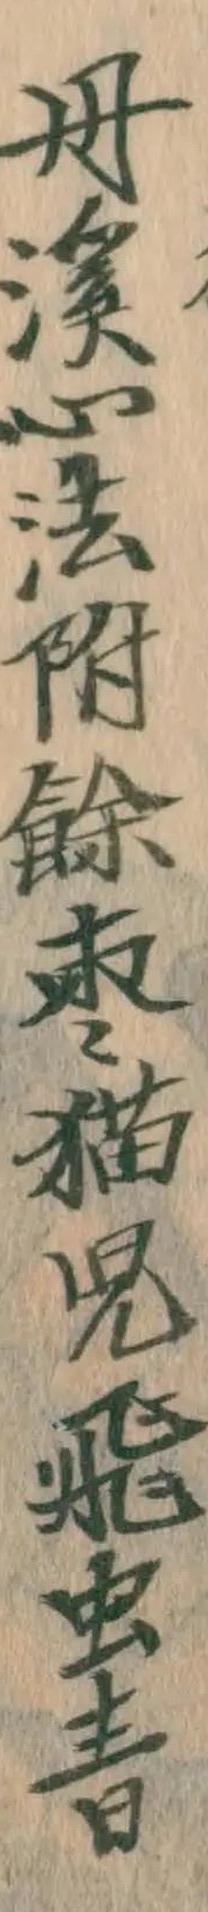丹渓心法附餘棗猫児飛虫青
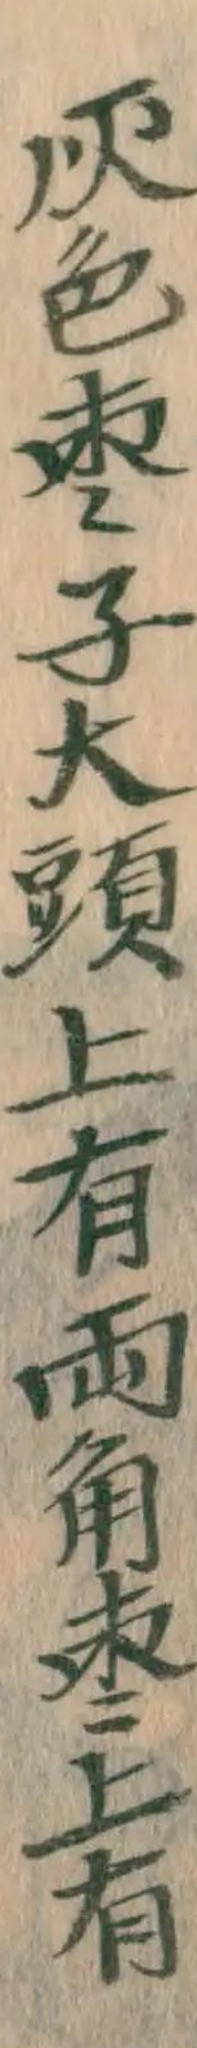灰色棗子大頭上有両角棗上有
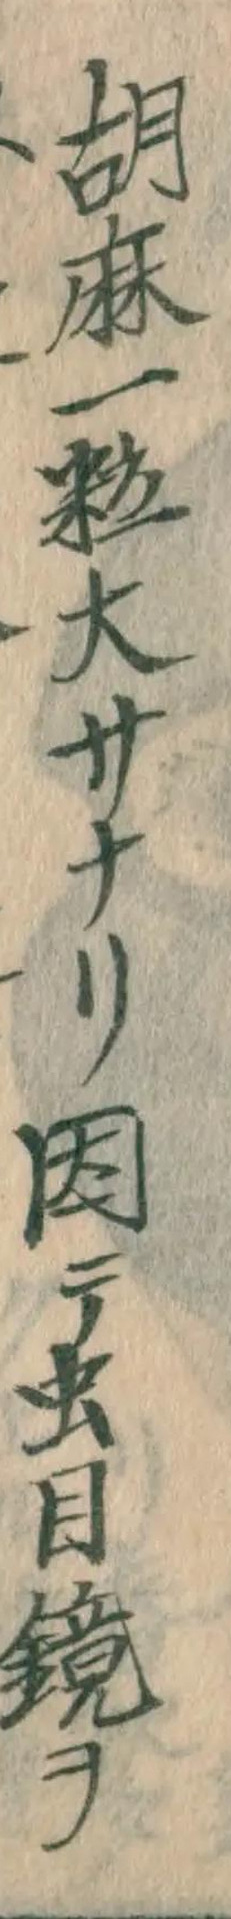胡麻一粒大サナリ因テ虫目鏡ヲ
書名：千蟲譜 3巻. [1]
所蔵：国立国会図書館 National Diet Library, JAPAN
